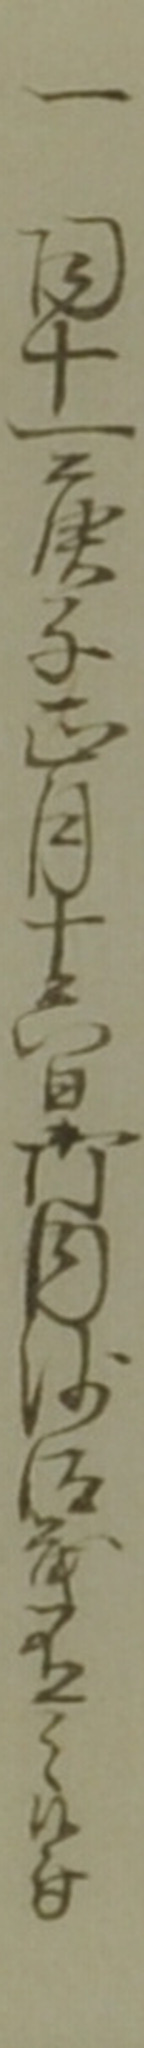一同十一庚子正月十六日御内沙汰茂有之候付
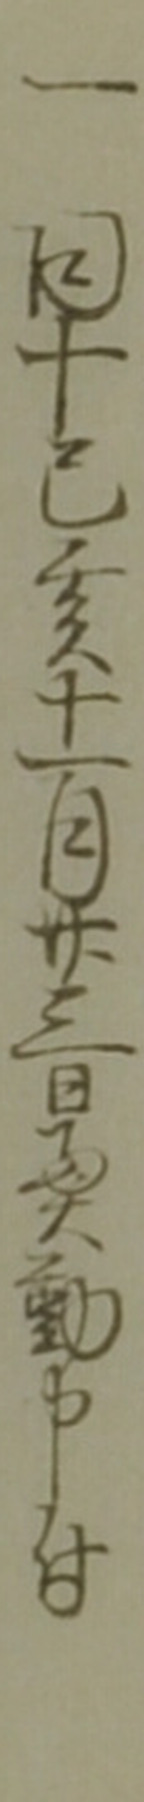一同十己亥十一月廿三日奥勤申付
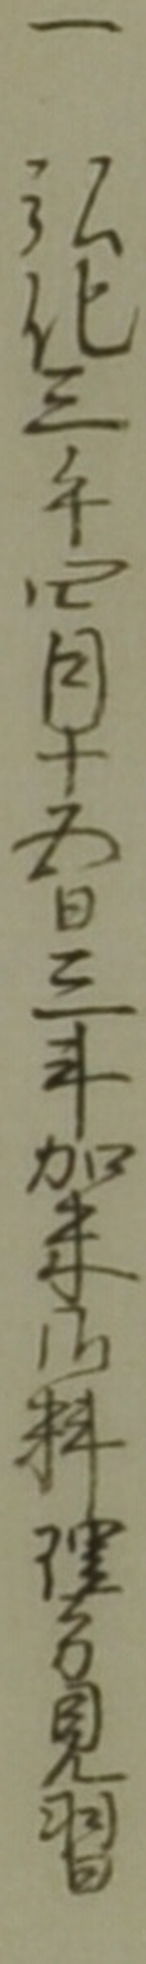一弘化三午詞四月十五日三斗加米御料理方見習
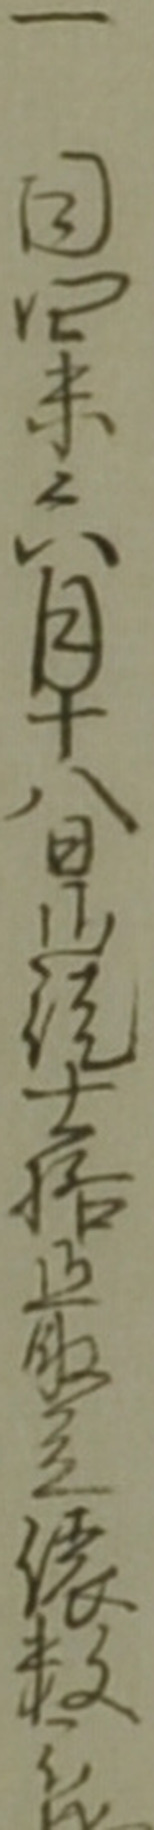一同四巳六月十八日御徒士格御取立俵数被成下
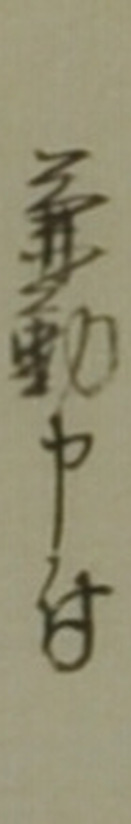兼勤申付
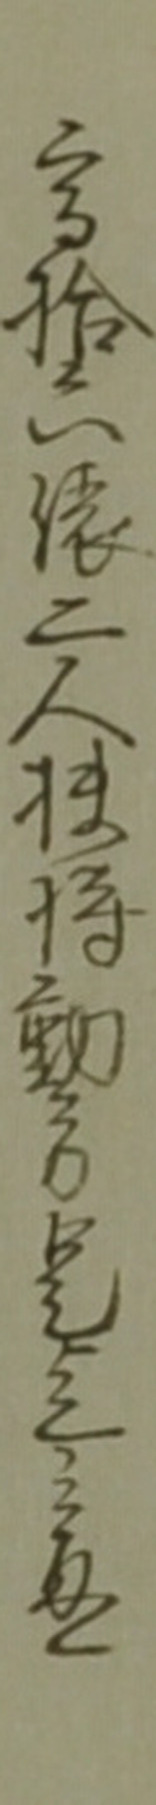高拾六俵二人扶持勤方是迄之通
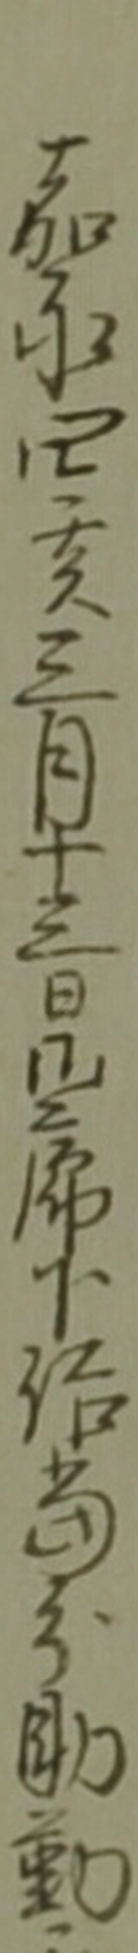一嘉永四亥三月十三日御廊下詰当分助勤被
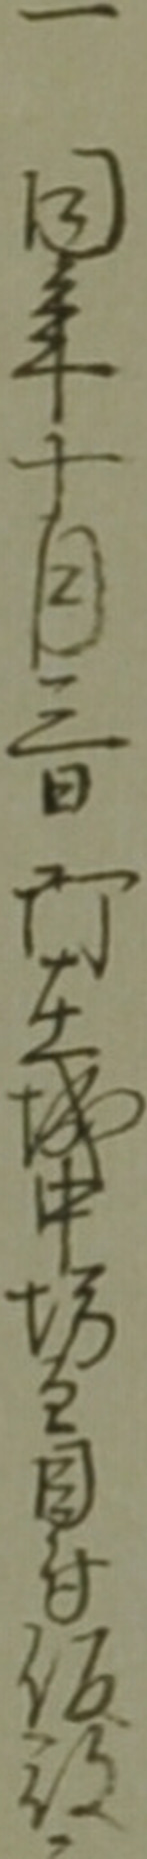一同年十月三日御在城中坊主目付仮役被
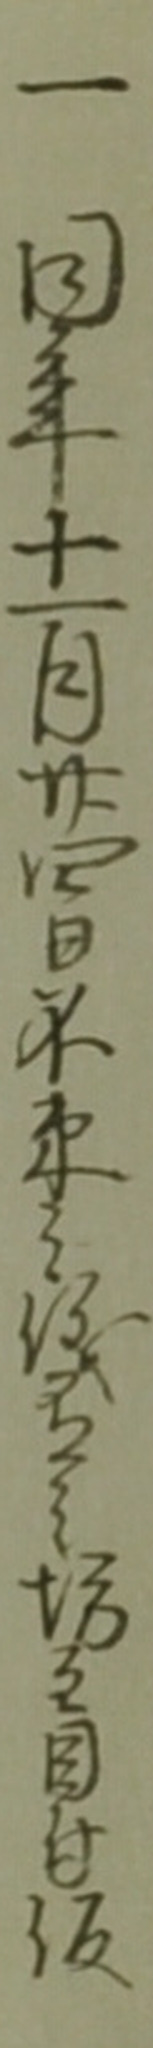一同年十一月廿四日不束之儀有之坊主目付仮
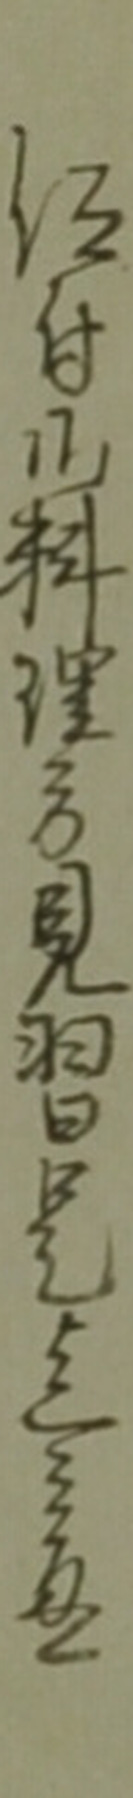仰付御料理方見習是迄之通
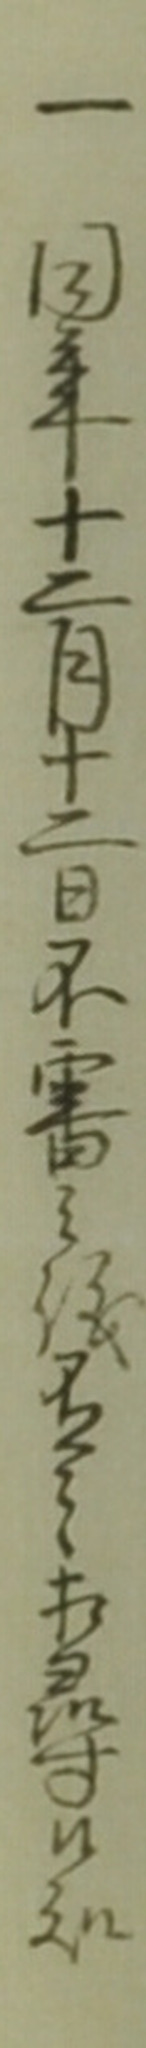一同年十二月十二月不審之儀有之相尋候処
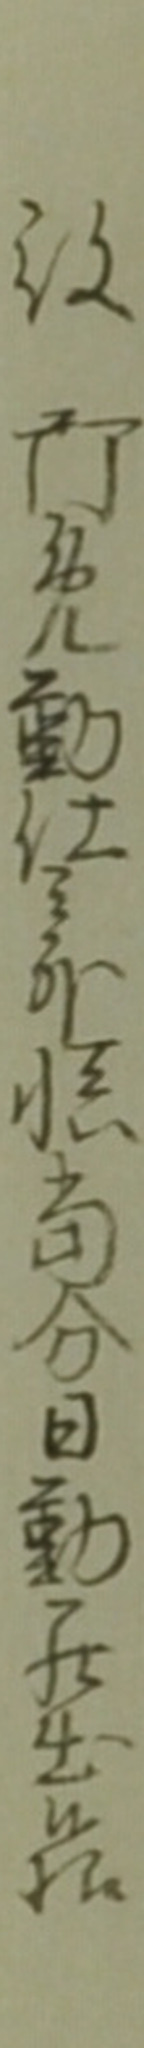役御免勤仕之外慎当分被勤罷出候様

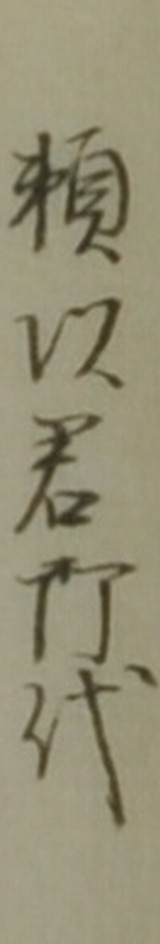頼以君御代
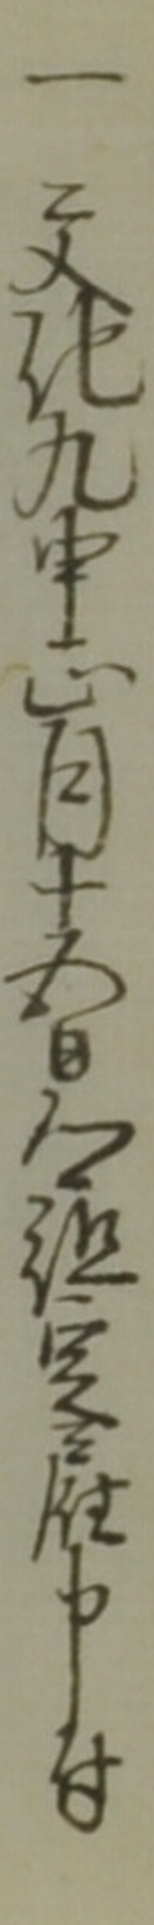一文化九申正月十五日郷組定雇申付
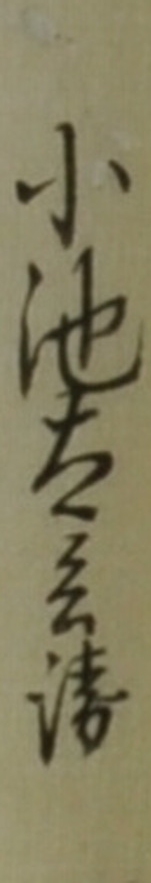小池太兵衛
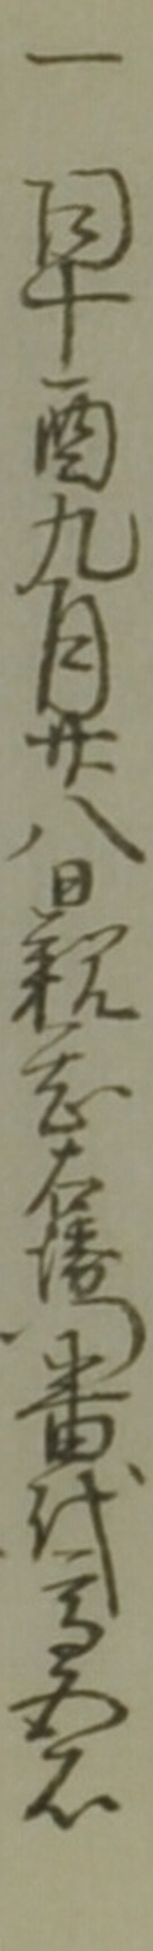一同十酉九月廿八日親甚右衛門番代高五石
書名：無足諸士勤仕録（八）
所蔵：伊那市立高遠町図書館・合同会社AMANE
